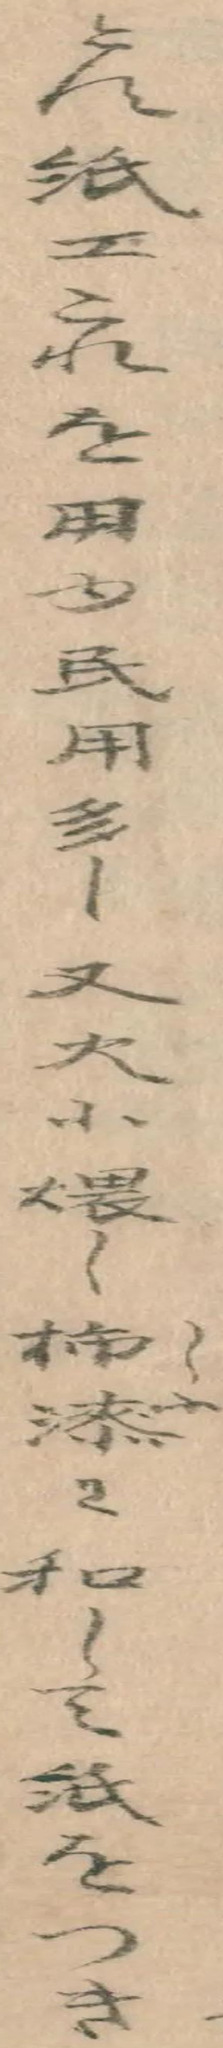とす紙工これを用ゆ民用多し又大小煨し柿漆に和して紙をつき

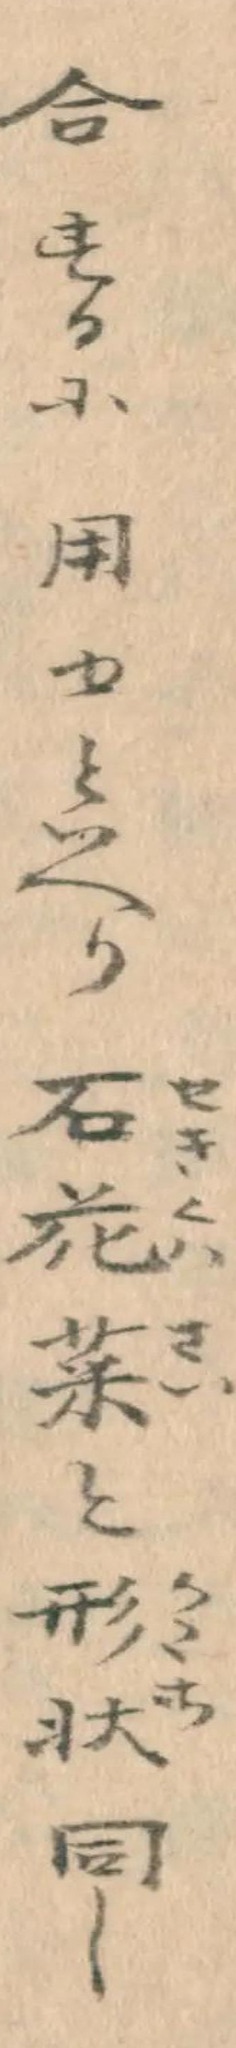合するに用ゆといへり石花菜と形状同し
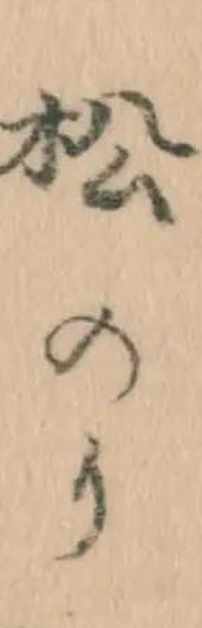松のり
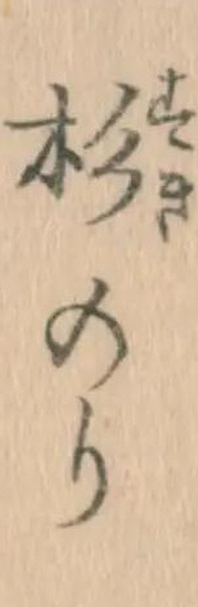松のり
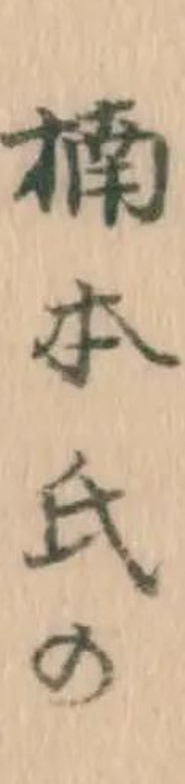楠本氏の
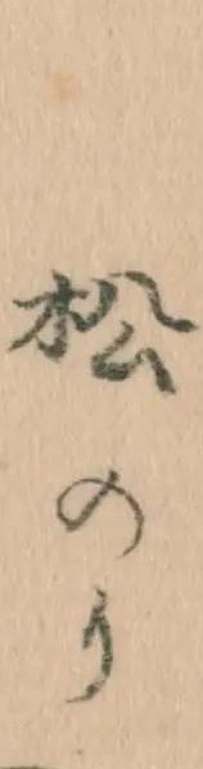松のり
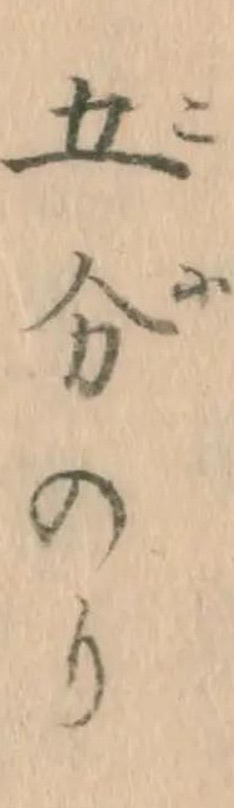五分のり
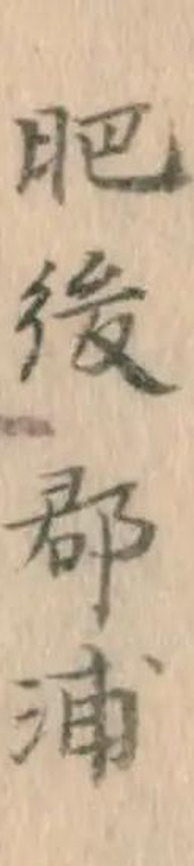肥後郡浦
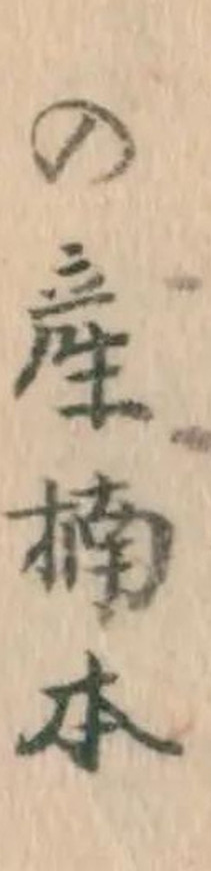の産楠本
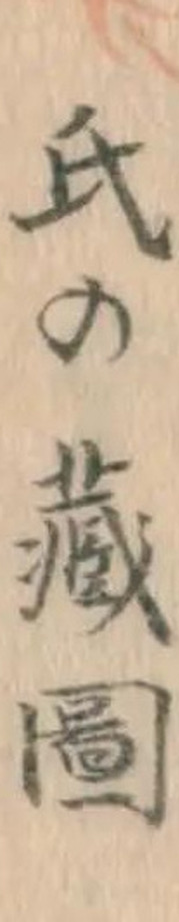氏の蔵図

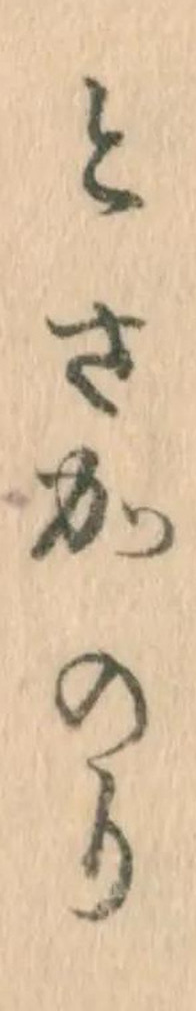とさかのり
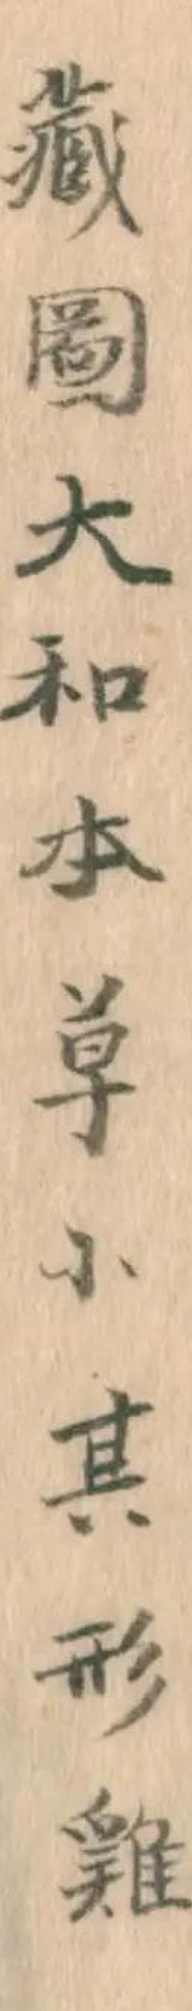蔵図大和本草に其形鶏
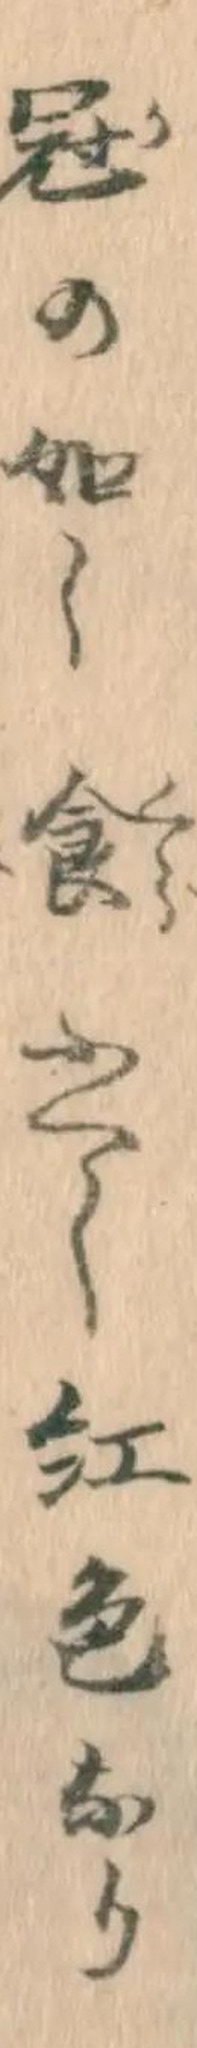冠の如し食ふへし紅色なり
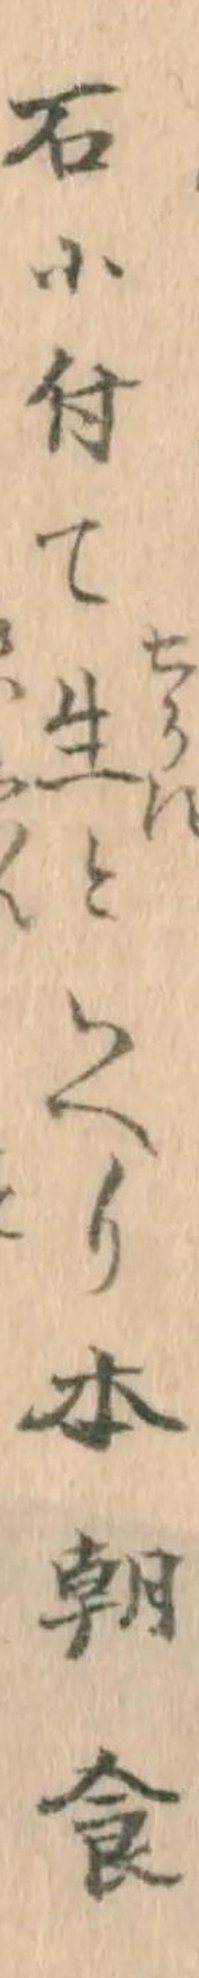石に付て生といへり本朝食
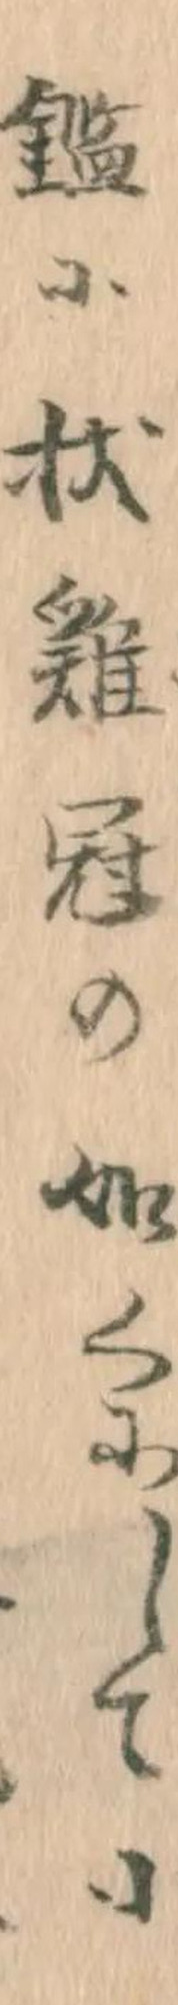鑑に状鶏冠の如くにして小
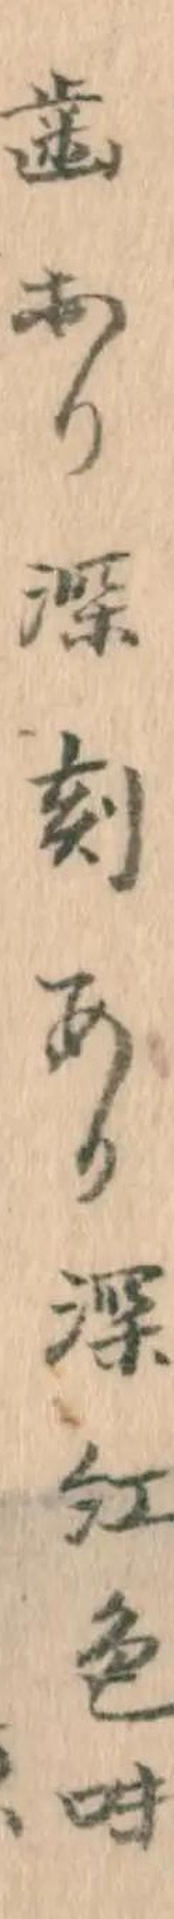歯あり深刻あり深紅色味
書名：本草図譜. 巻52-54
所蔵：国立国会図書館 National Diet Library, JAPAN
